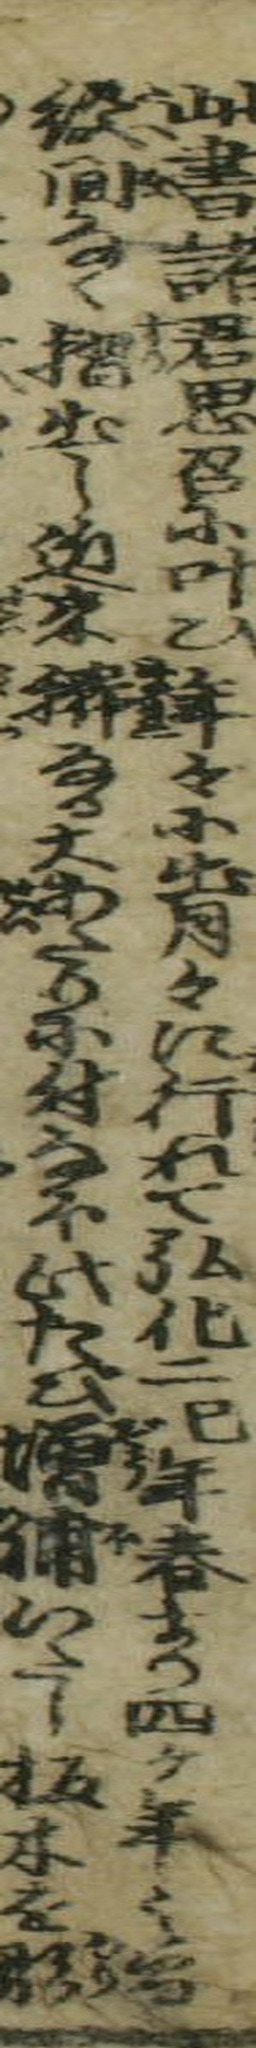絶間なく摺出し近来稀なる大あたりに付なほ此たび増補いたし板木を彫
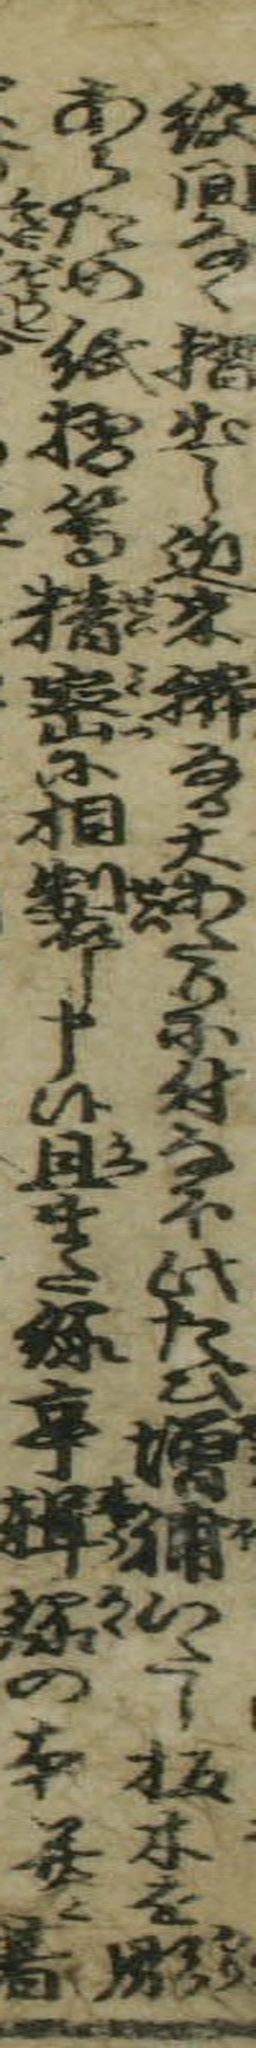あらため紙摺等精密に相製し申候且また緑亭輯録の本并に著
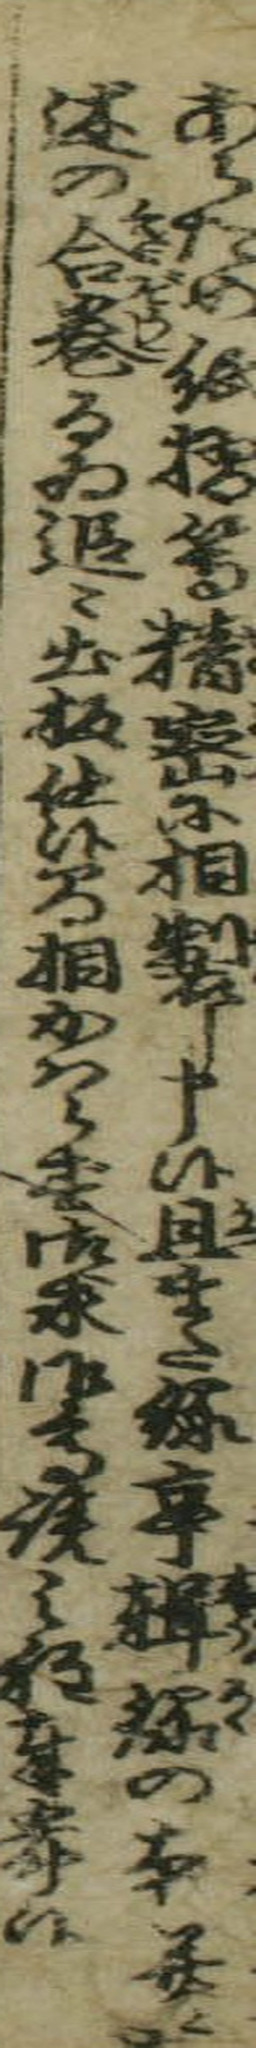述の合巻るゐ追々出板仕候間相かはらず御求御高読の程奉希候
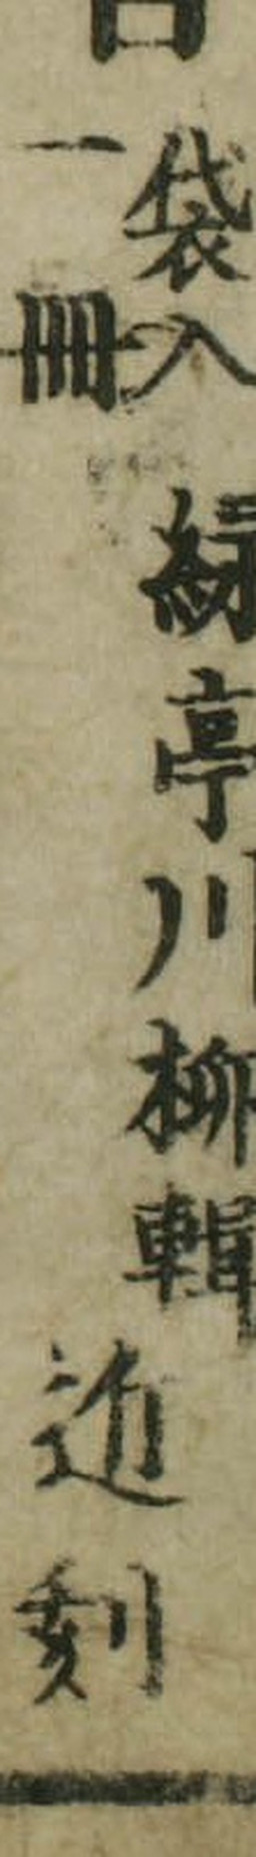一冊近刻
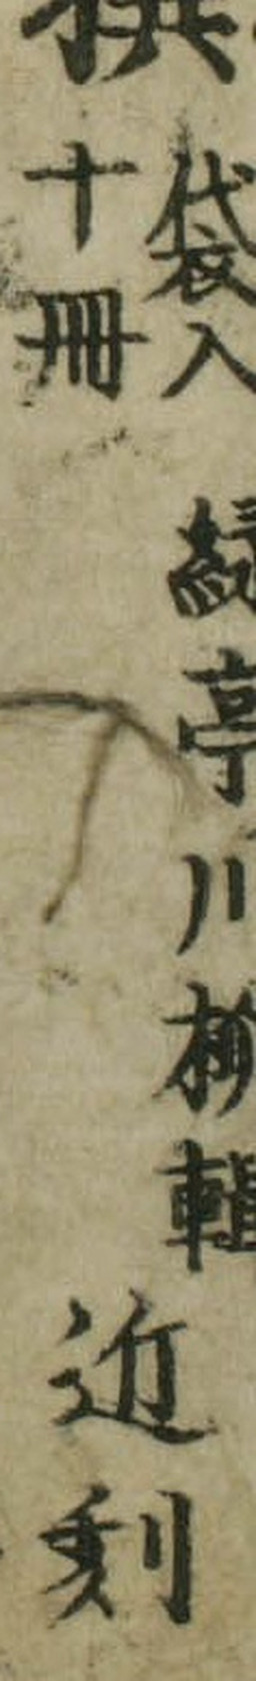十冊近刻
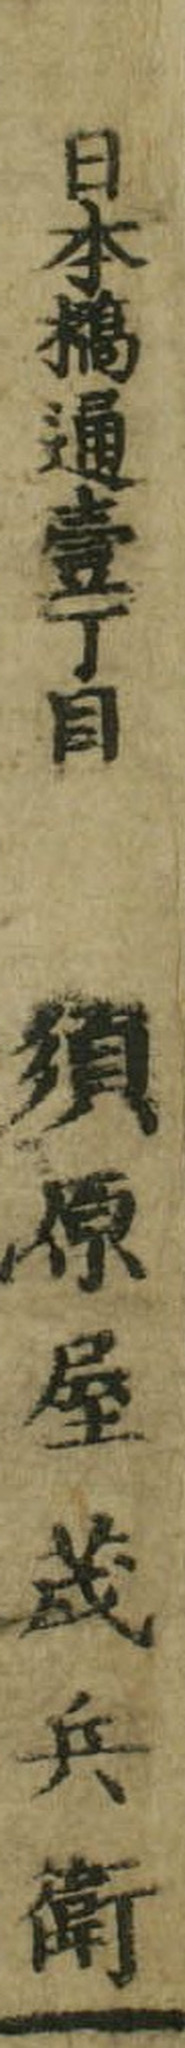日本橋通一丁目須原屋茂兵衛
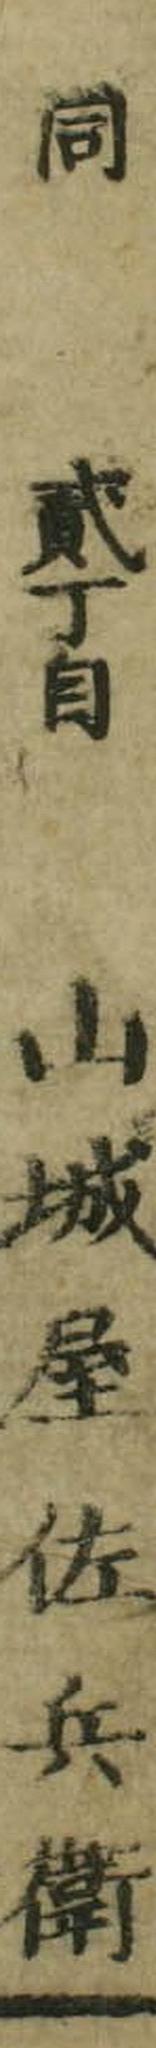同二丁目山城屋佐兵衛
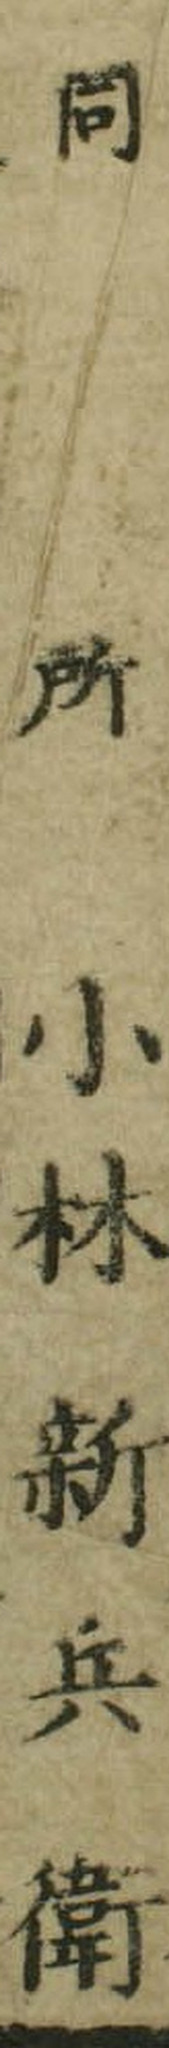同所小林新兵衛
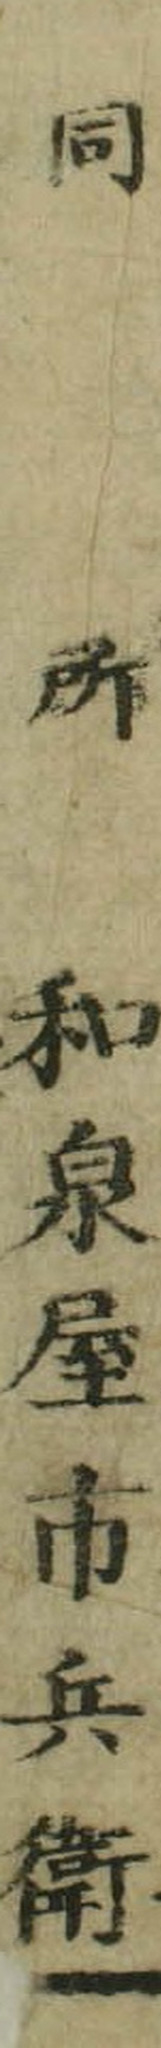同所和泉屋市兵衛
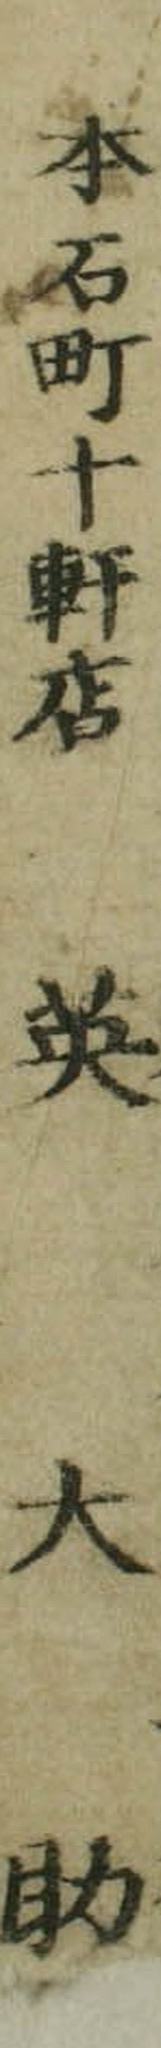本石町十軒店英大助
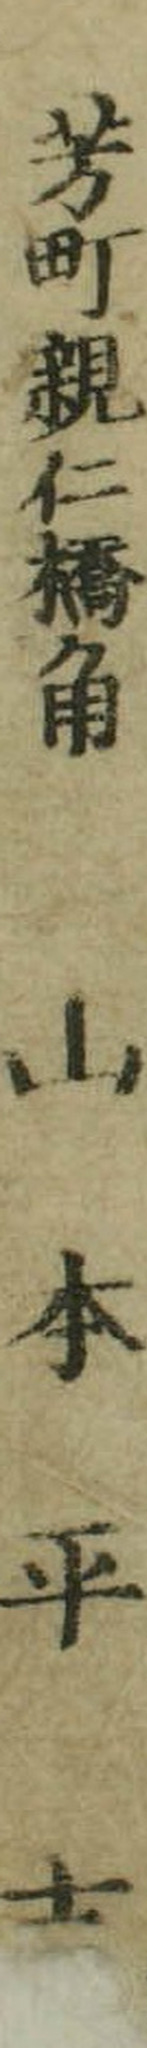芳町親仁橋角山本平吉
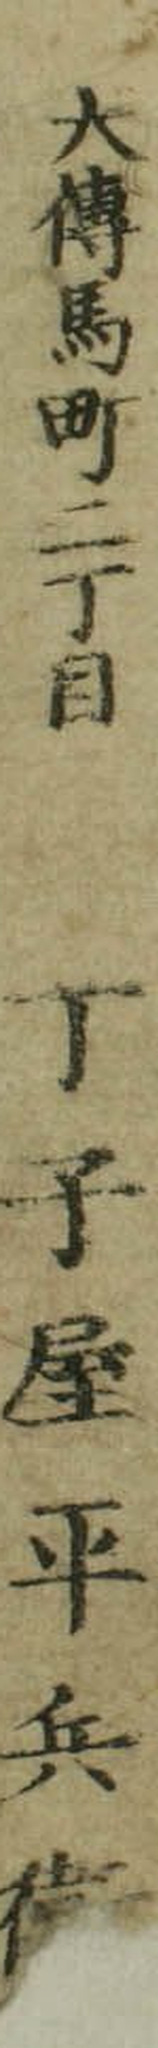大伝馬町二丁目丁子屋平兵衛
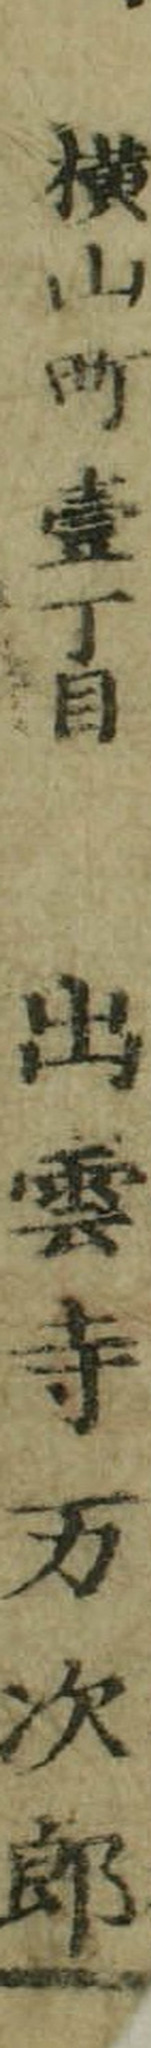書林横山町一丁目出雲寺万次郎
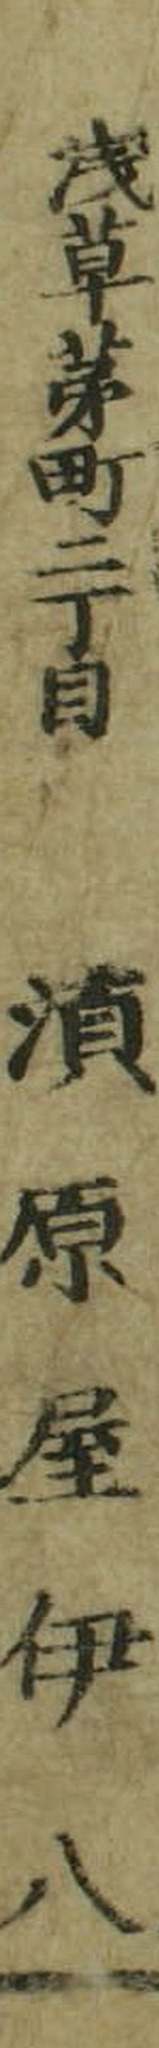浅草茅町二丁目須原屋伊八
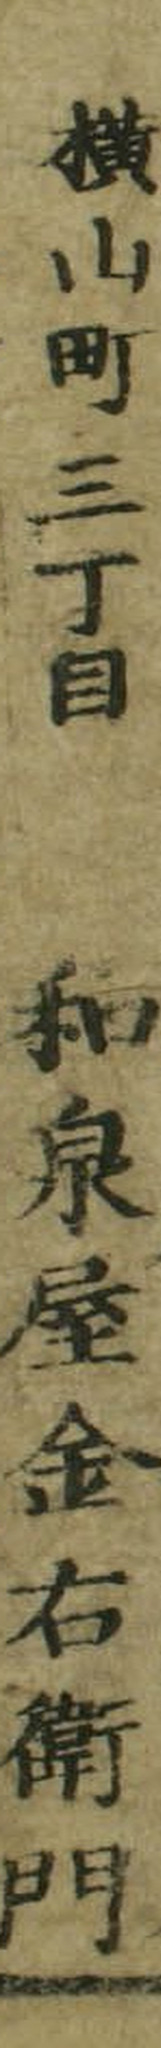横山町三丁目和泉屋金右衛門
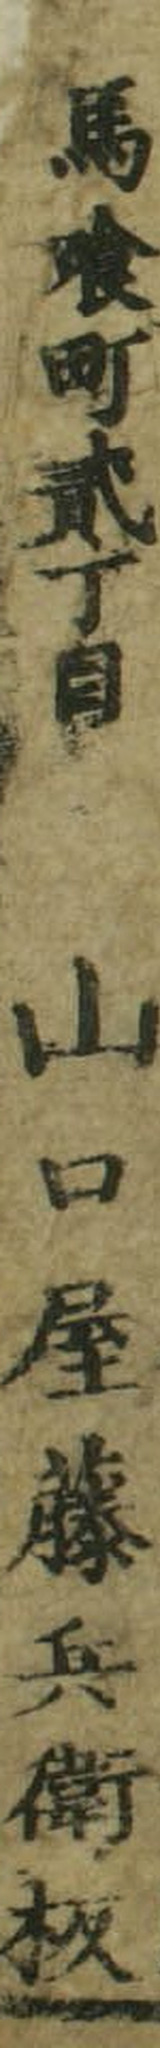馬喰町二丁目山口屋藤兵衛板
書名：續英雄百人一首
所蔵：東京学芸大学附属図書館
